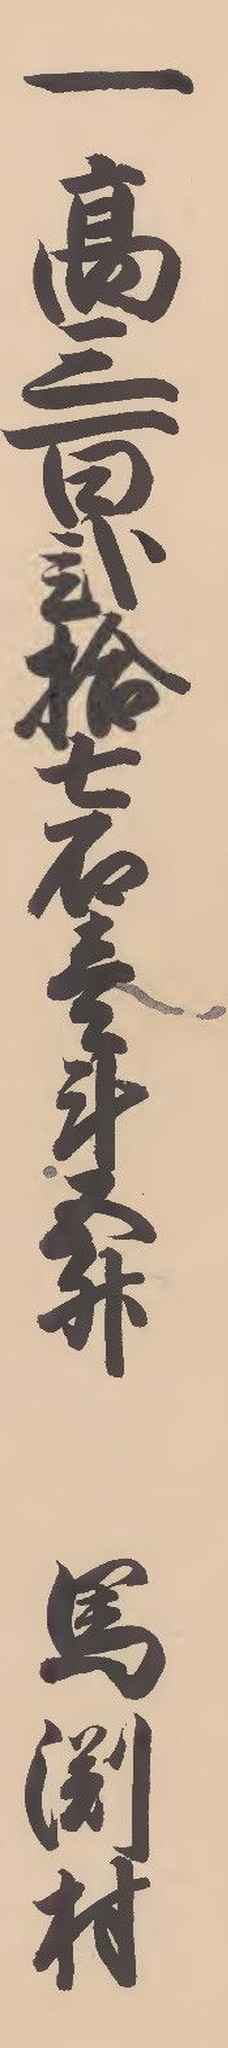一高三百弐拾七石壱斗五升馬渕村
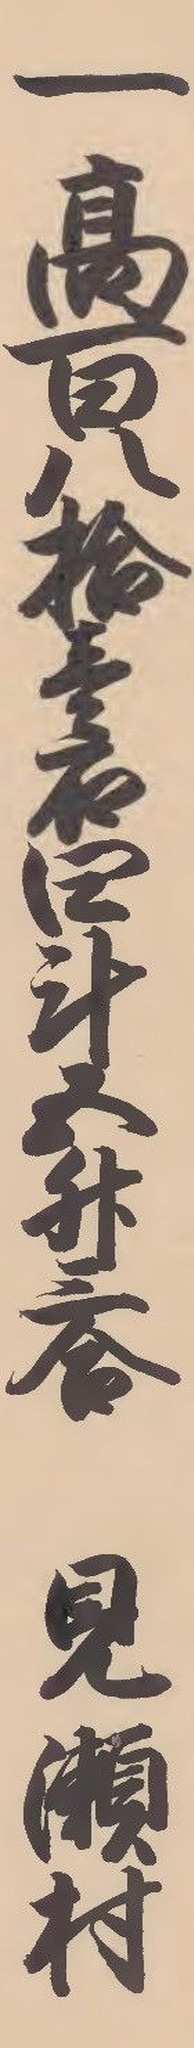一高百八拾壱石四斗五升三合見瀬村
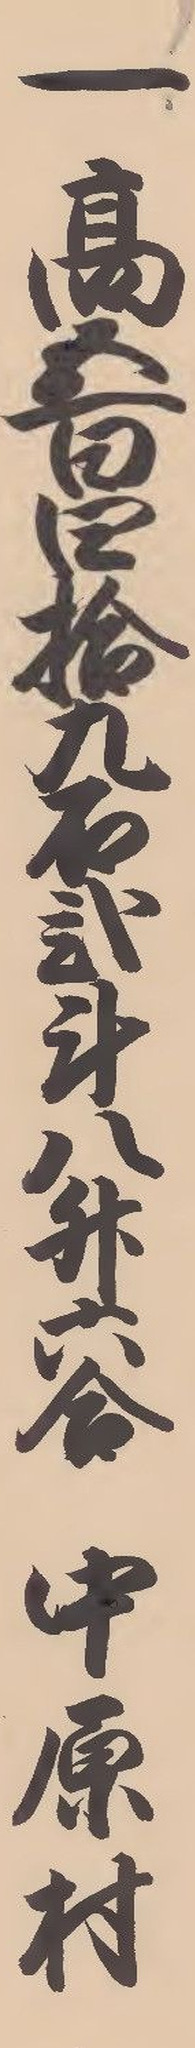一高五百四拾九石弐斗八升六合中原村
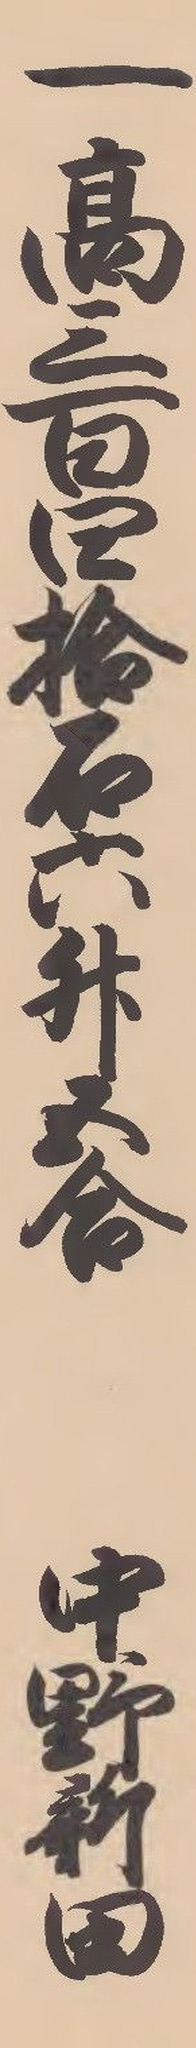一高三百四拾石六升五合中野新田
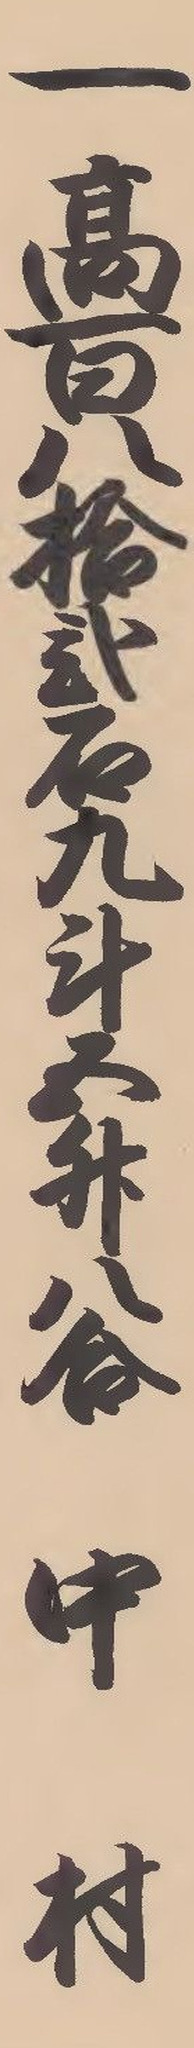一高百八拾弐石九斗五升八合中村
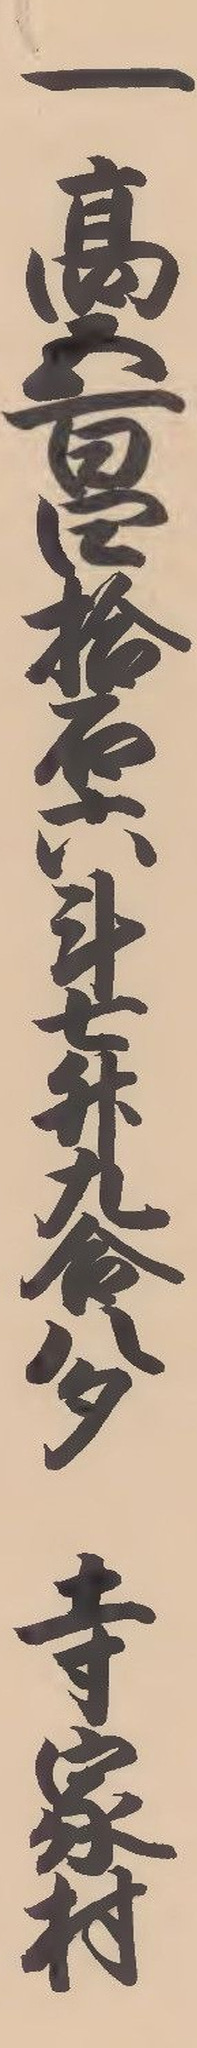一高五百四拾石六斗七升九合八勺寺家村
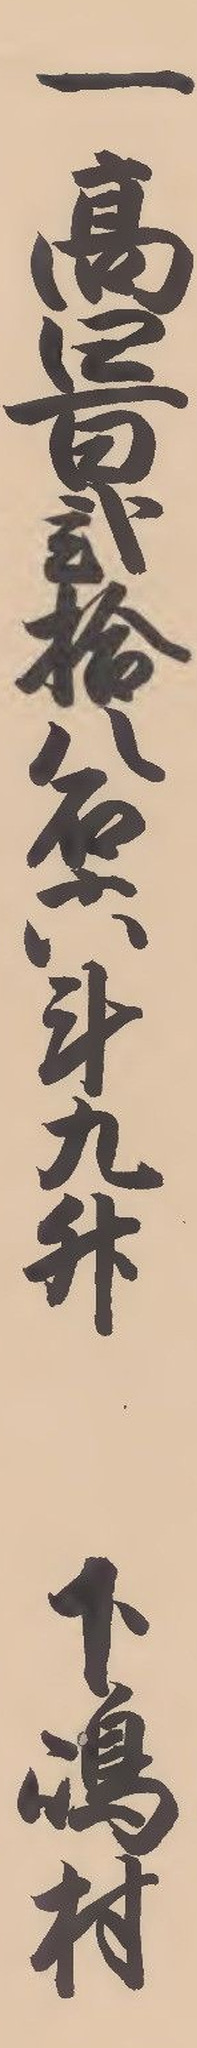一高四百弐拾八石六斗九升下島村
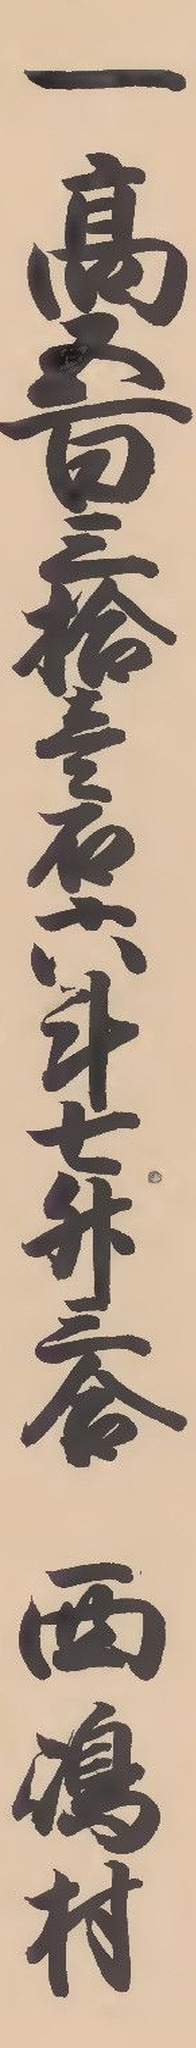一高五百三拾壱石六斗七升三合西島村

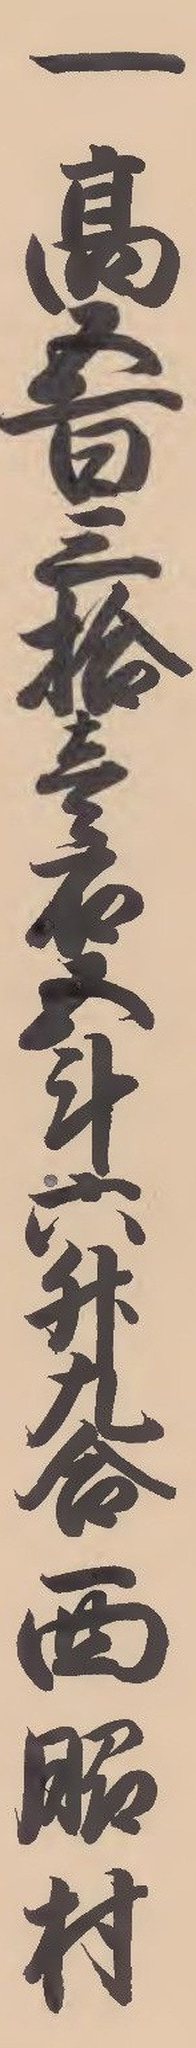一高五百三拾壱石五斗六升九合西脇村
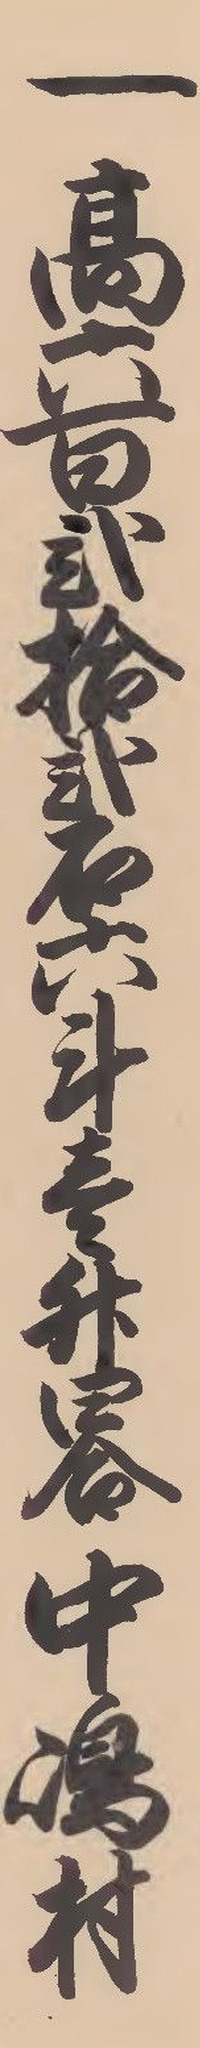一高六百弐拾弐石六斗壱升四合中島村
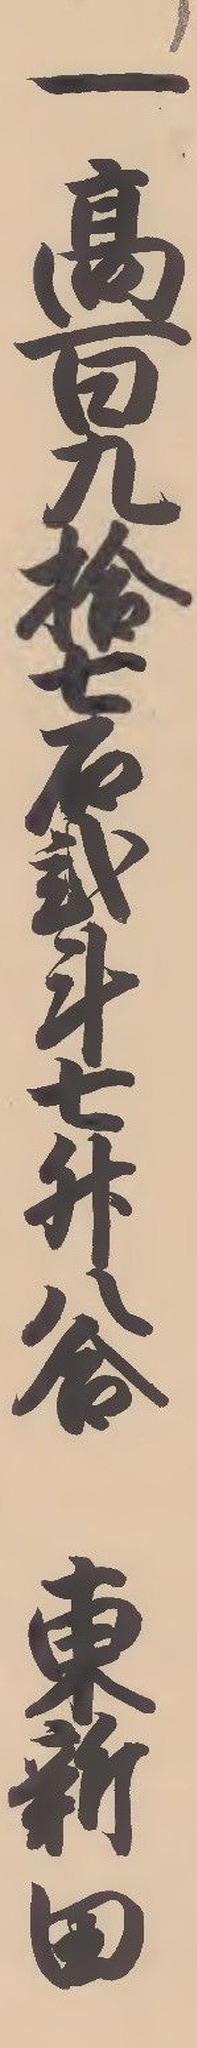一高百九拾七石弐斗七升八合東新田
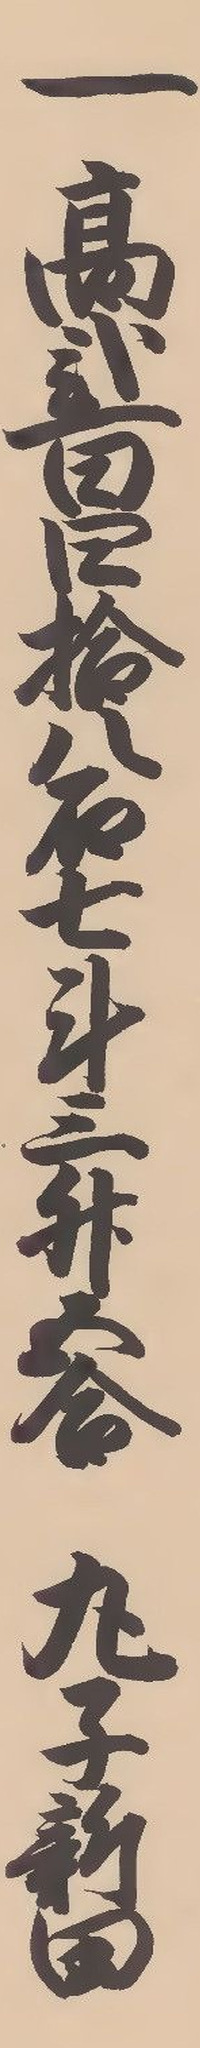一高弐百四拾八石七斗三升五合丸子新田
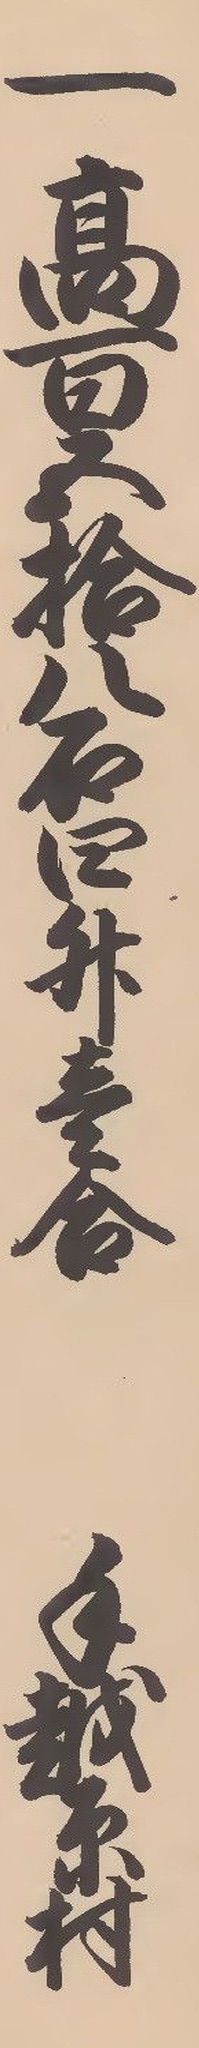一高百五拾八石四升壱合手越原村
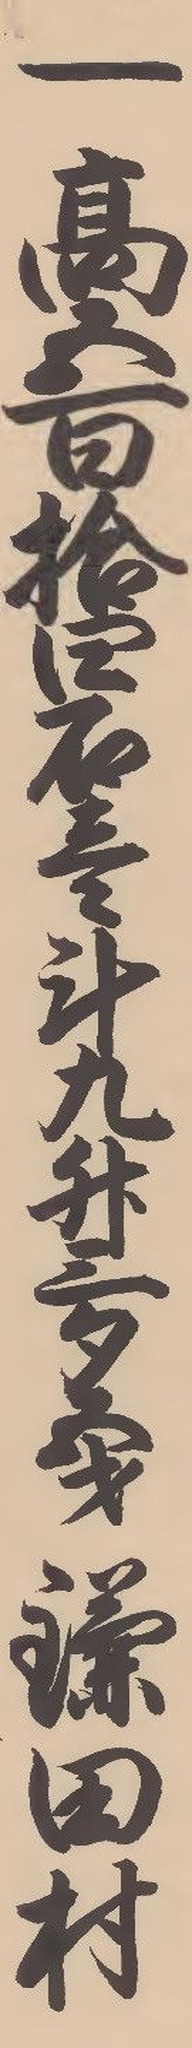一高五百拾四石壱斗九升三勺五才鎌田村
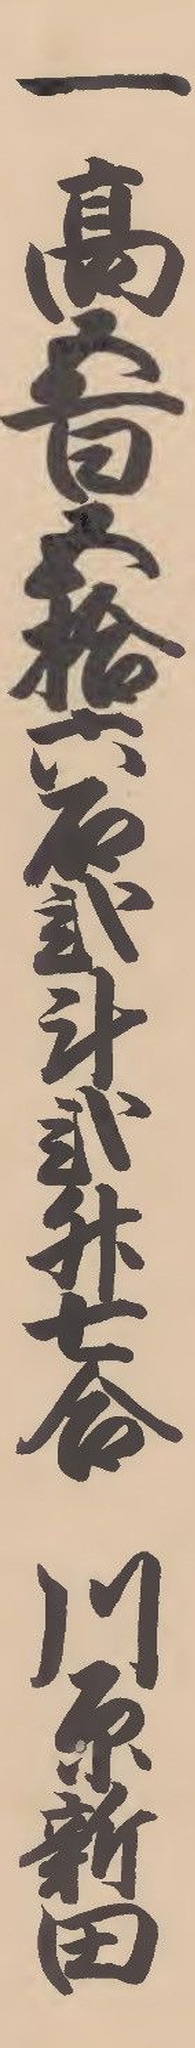一高五百五拾六石弐斗弐升七合川原新田
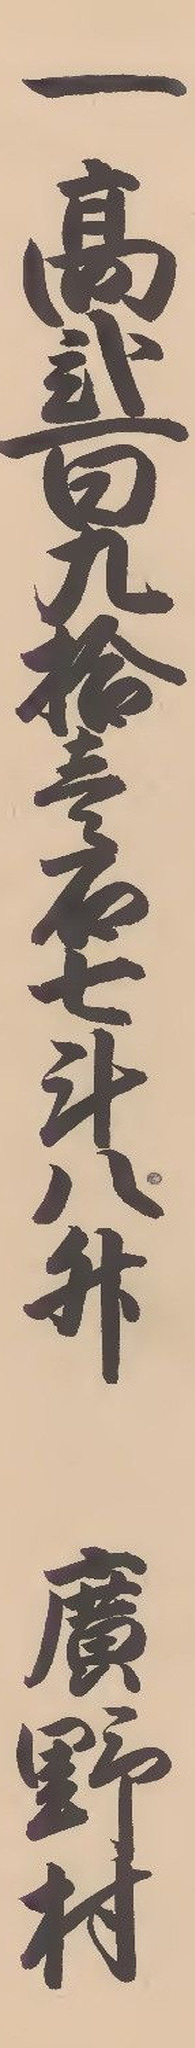一高弐百九拾壱石七斗八升広野村
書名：駿河国郷帳
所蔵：国立公文書館 National Archives of Japan
